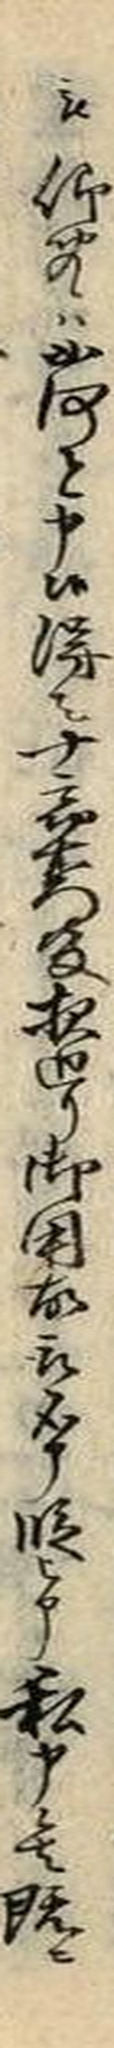被仰聞候は如何と申候得は十郎右衛門殿夜廻り御用故取不申段被申私申候は既に
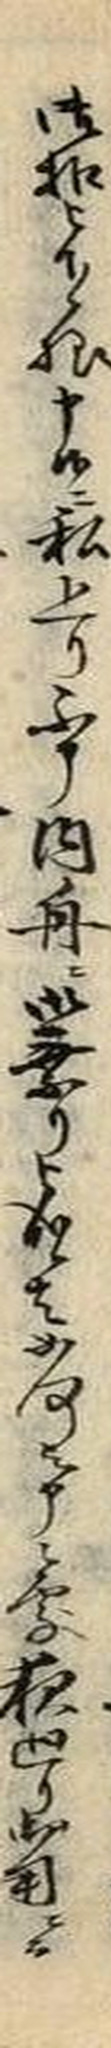御控被下候様申候に私上り不申内舟に御乗り被成候は如何と申候処夜廻り御用にて
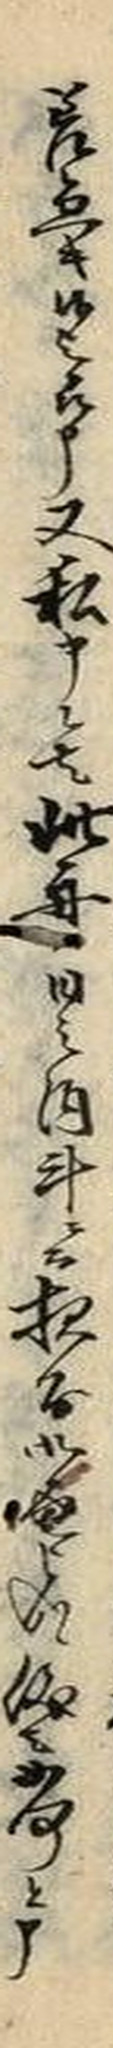差急キ候と被申又私申候は此舟は日之内斗にて夜分御通被成候儀は如何と申
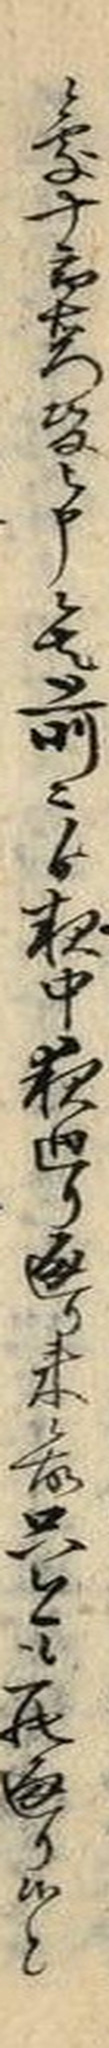候処十郎右衛門殿被申候は前々ゟ夜中夜廻り通り来候故只今も罷通り候と
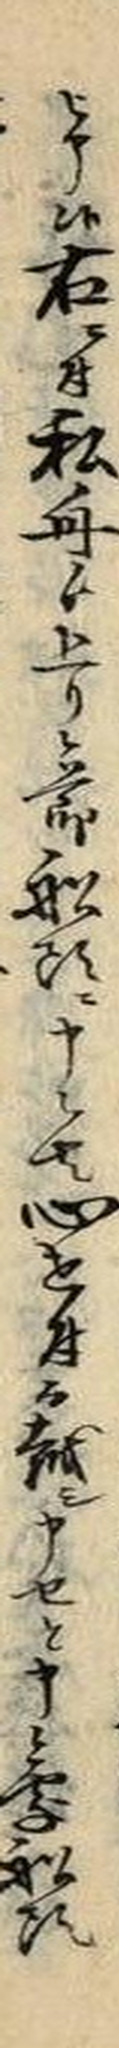被申候右に付私舟ゟ上り候節船頭に申候は心を付て越シ申セと申候処船頭
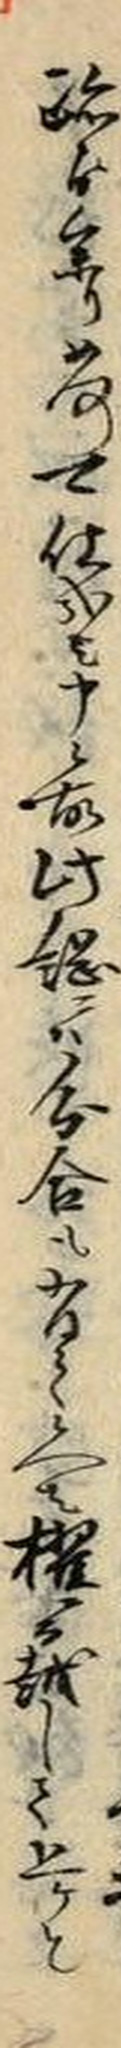跡ゟ参り如何可仕哉と申候故此綱には分合も有之候へは櫂にて越して上ケと

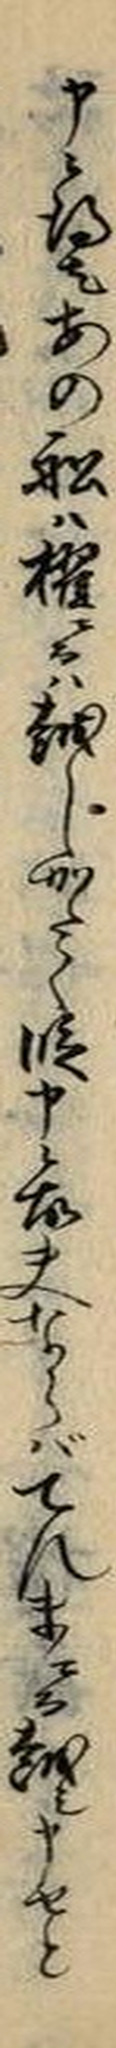申候得はあの船は櫂にては越しかたく段申候故夫ならばてんまにて越シ申セと
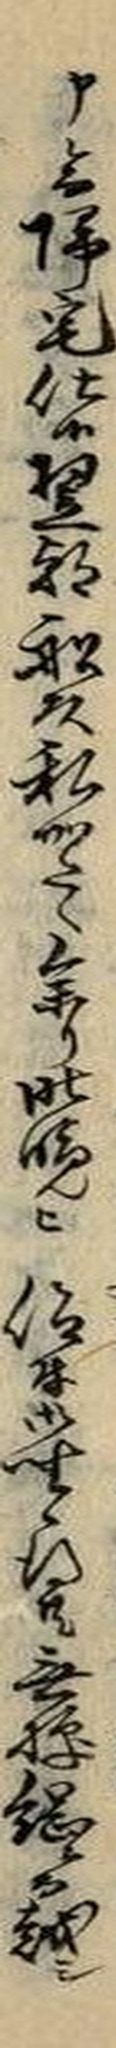申候て帰宅仕候翌朝船頭私かたへ参り昨晩被仰付御坐候得共無拠綱にて越シ
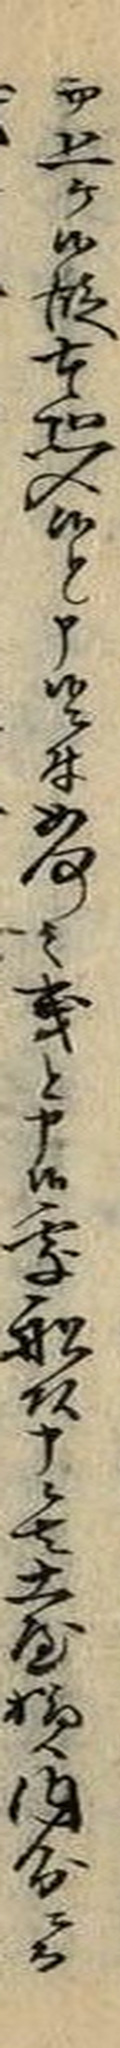て上ケ候段奉恐入候と申候に付如何之義と申候処船頭申候は土屋様内分にて
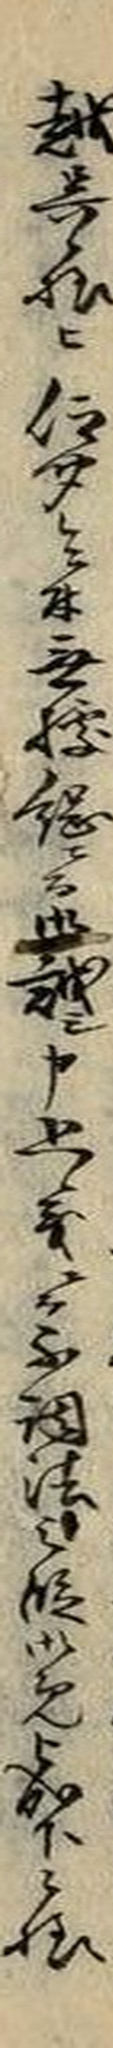越呉候様被仰聞候に付無拠綱にて御越シ申上候義にて不調法之段御免被成下候様
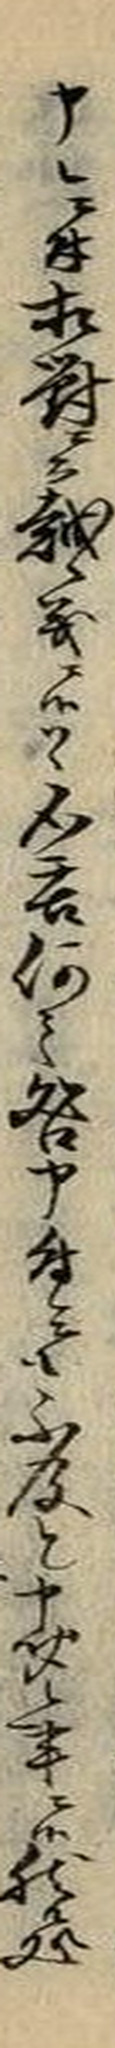申候に付相対にて越候義に候はゝ不苦何之咎申付候にも不及と申聞候事に候然ル処
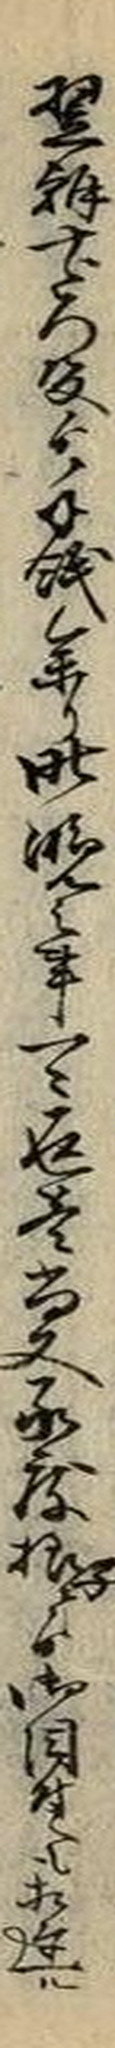翌朝十郎右衛門殿ゟ手紙参り昨晩之事一々返答尚又承度様子にゟ御目付へも相達ル
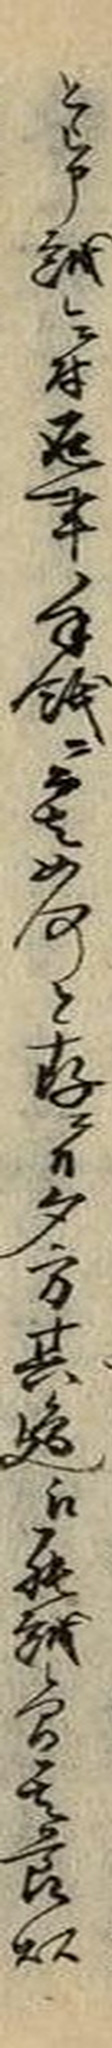と被申越候に付返事手紙にては如何と存に付夕方其辺え罷越候間其節以
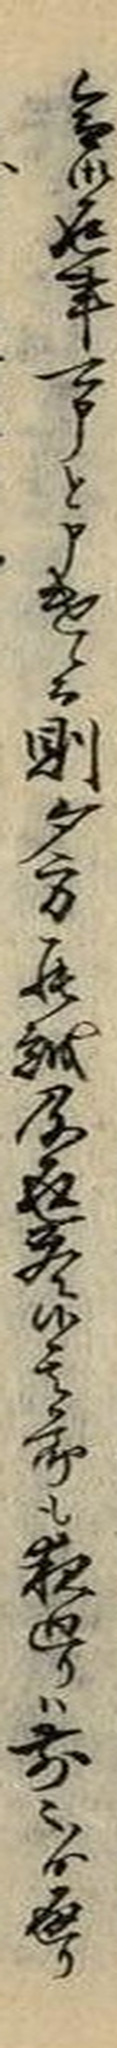参御返事可申と申遣候て則夕方罷越及返答候其節も夜廻りは前々ゟ通り
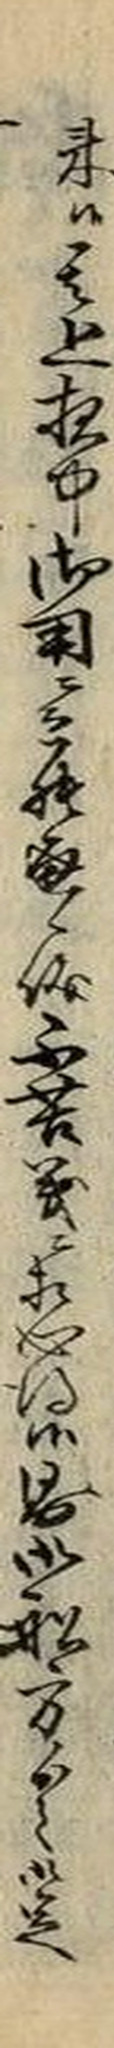来候其上夜中御用にて罷通候儀不苦義に相心得候則御船方ゟ之御定
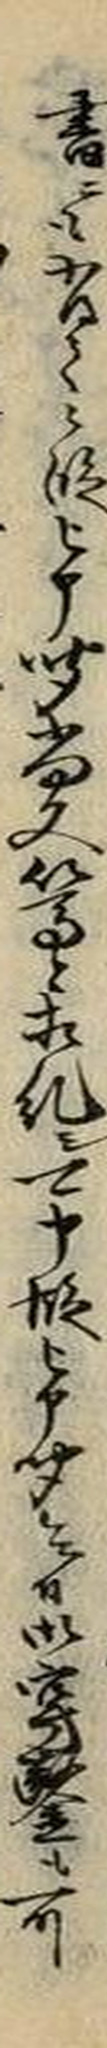書にも有之候段被申聞尚又篤と相糺シ可申段被申聞候に付御穿鑿も可
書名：御城下諸事之部
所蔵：福井県文書館 Fukui Prefectural Archives
